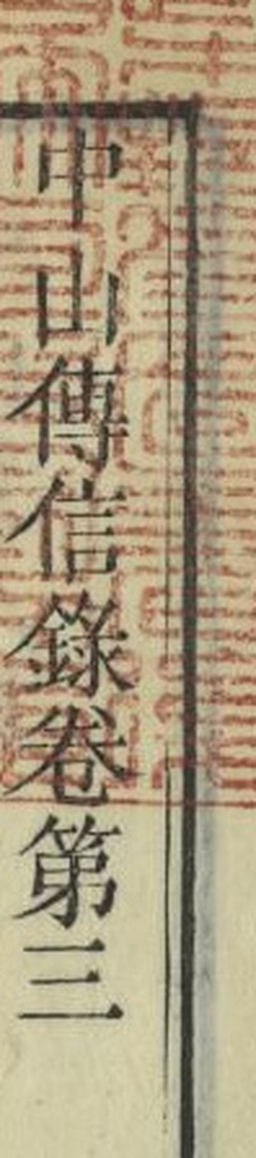中山伝信録巻第三

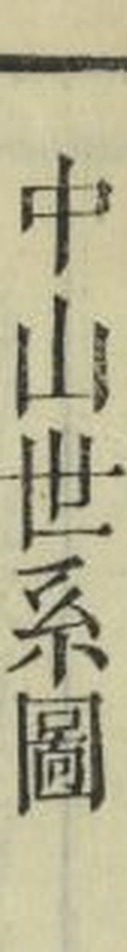中山世系図

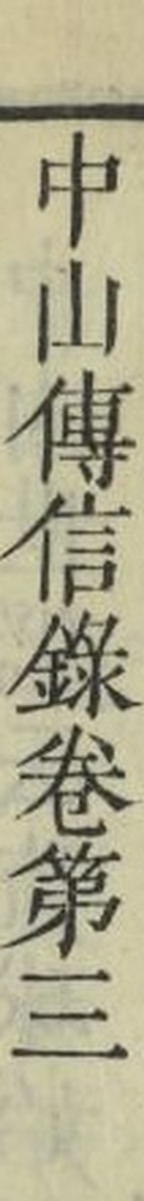中山伝信録巻第三
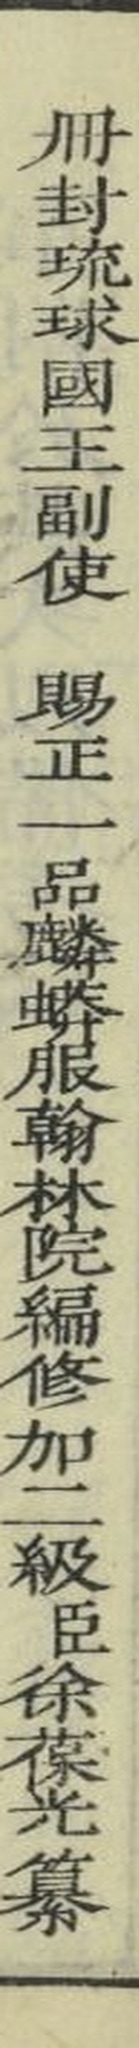冊封琉球国王副使賜正一品麟蟒服翰林院編修加二級臣徐葆光纂
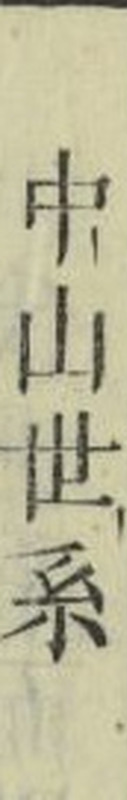中-山世-系

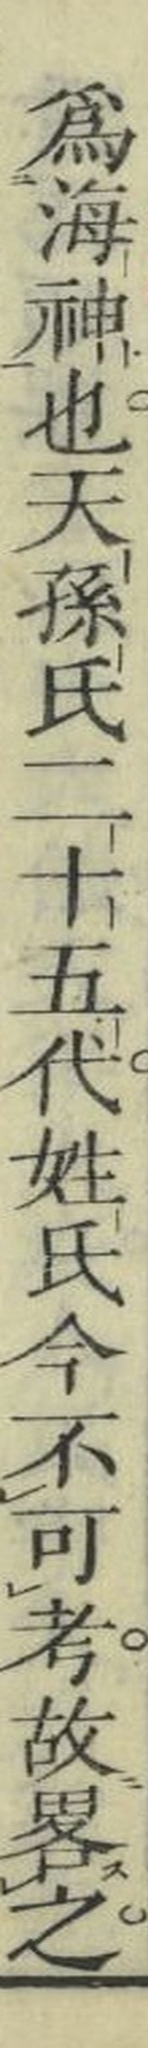為海-神也。天-孫-氏二-十-五-代。姓-氏今不可考。故略之。

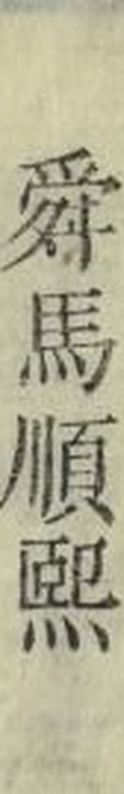舜馬順熙
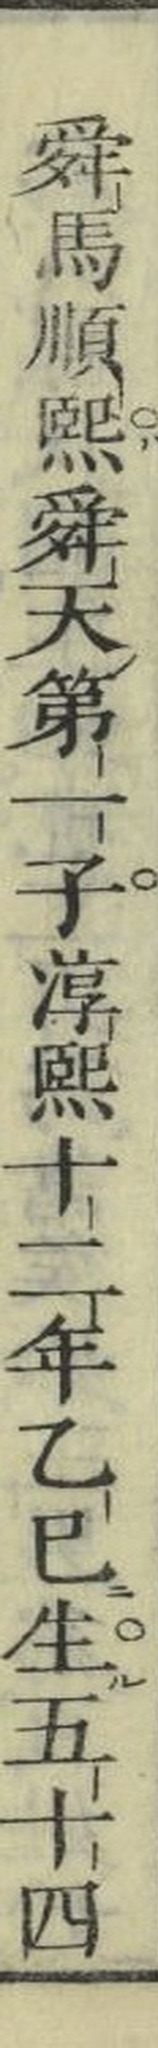舜-馬順-熙。舜-天第-一-子。淳-熙十-二-年乙-巳生。五-十-四
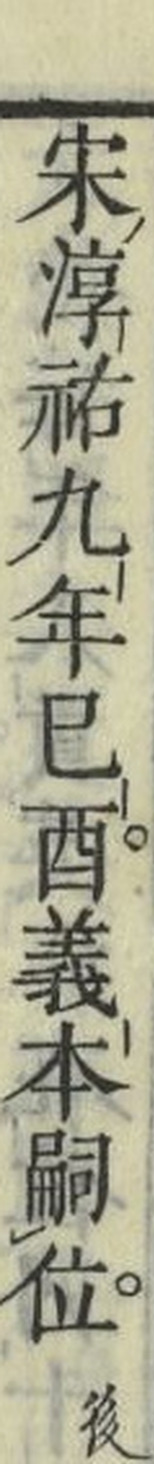宋淳-祐九-年巳-酉。義-本嗣位。

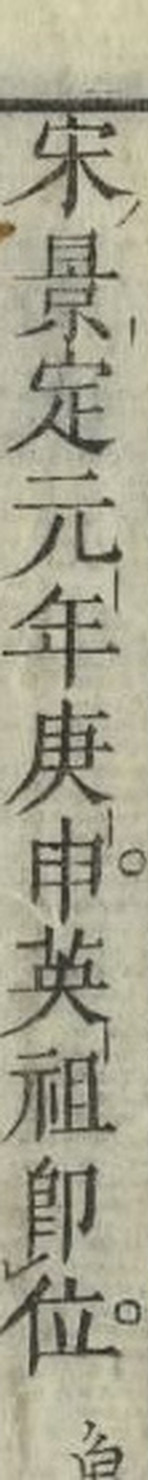宋景-定元-年庚-申。英-祖即位。
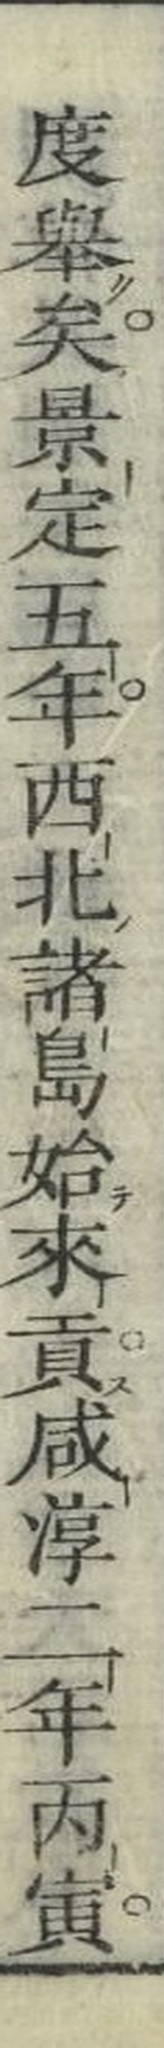度挙矣。景-定五-年。西-北諸-島始来-貢。咸-淳二-年丙-寅。
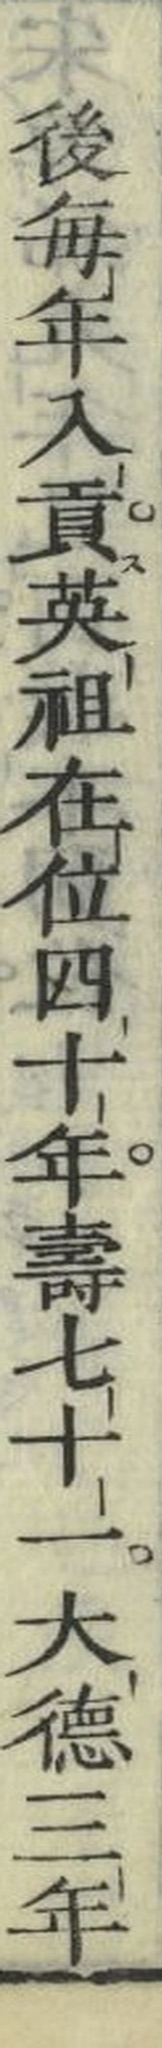後毎-年入-貢。英-祖在-位四-十-年。寿七-十-一。大-徳三-年
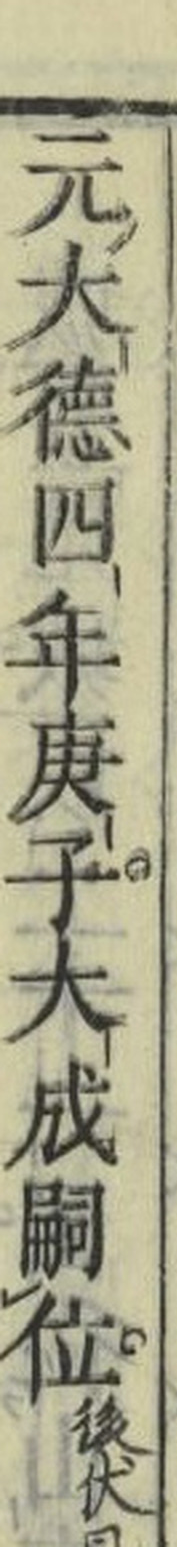元大-徳四-年庚-子。大-成嗣位。
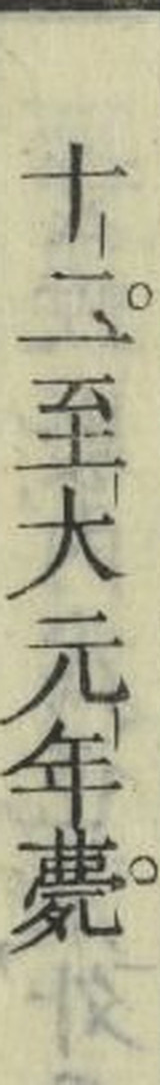十-二。至-大元-年薨。
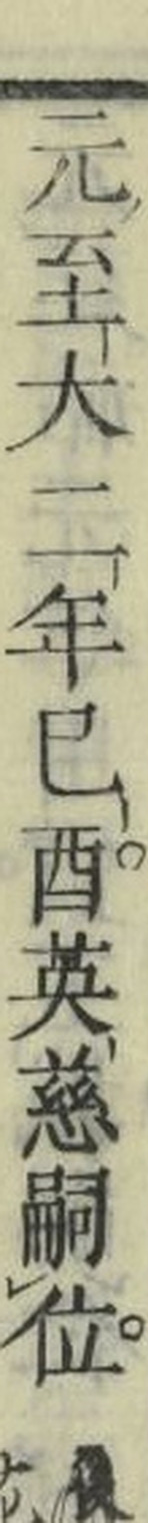元至-大二-年巳-酉。英-慈嗣位。

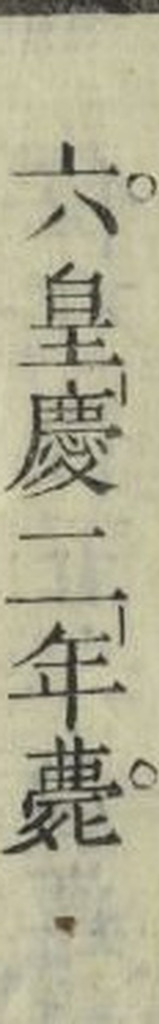六。皇-慶二-年薨。
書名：中山伝信録 巻三
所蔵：University of the Ryukyus Library
